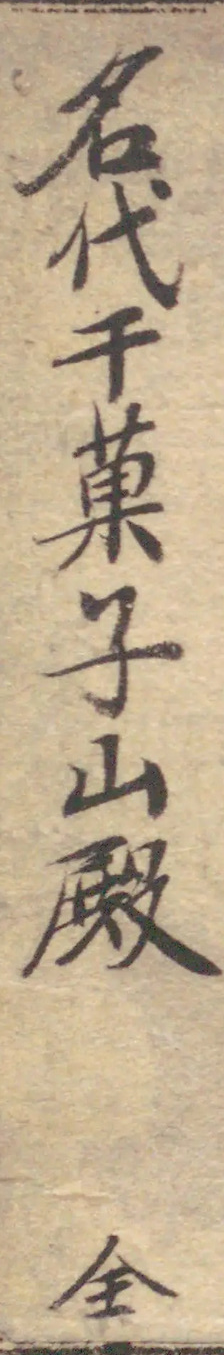名代干菓子山殿全
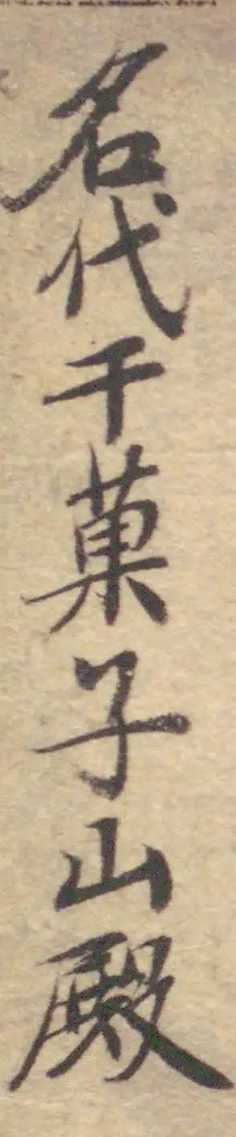名代干菓子山殿全

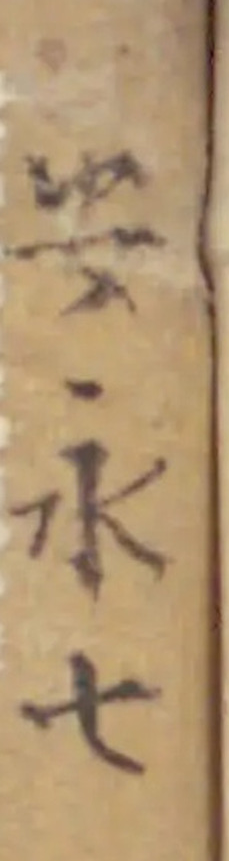安永七
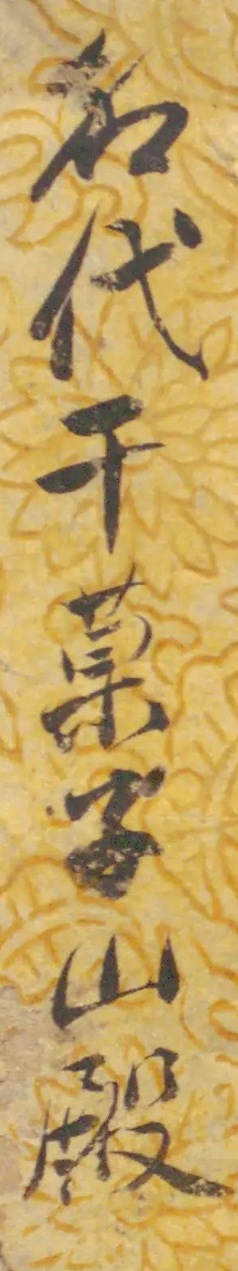名代干菓子山殿完

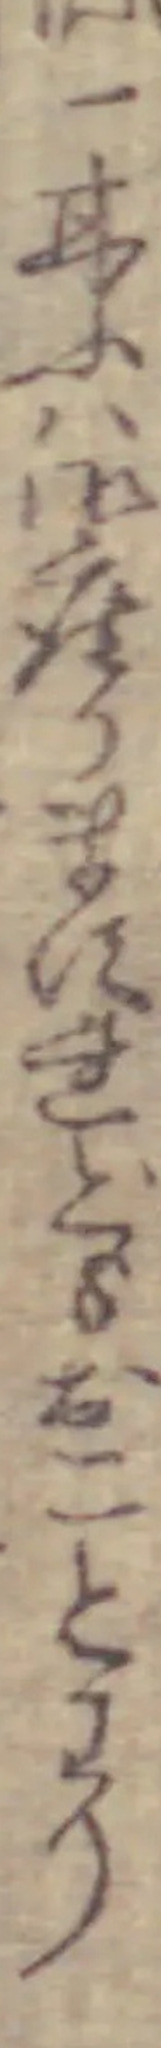一甘ふは御座りますれどもおことわり
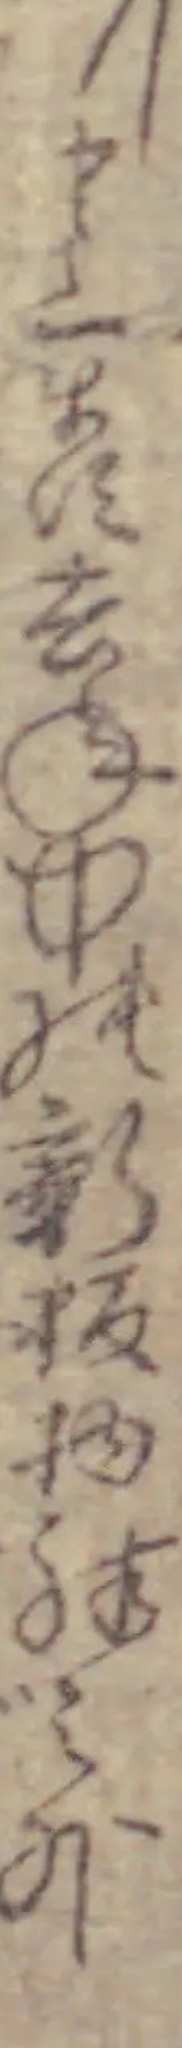申上ます去年中の新板物殊之外
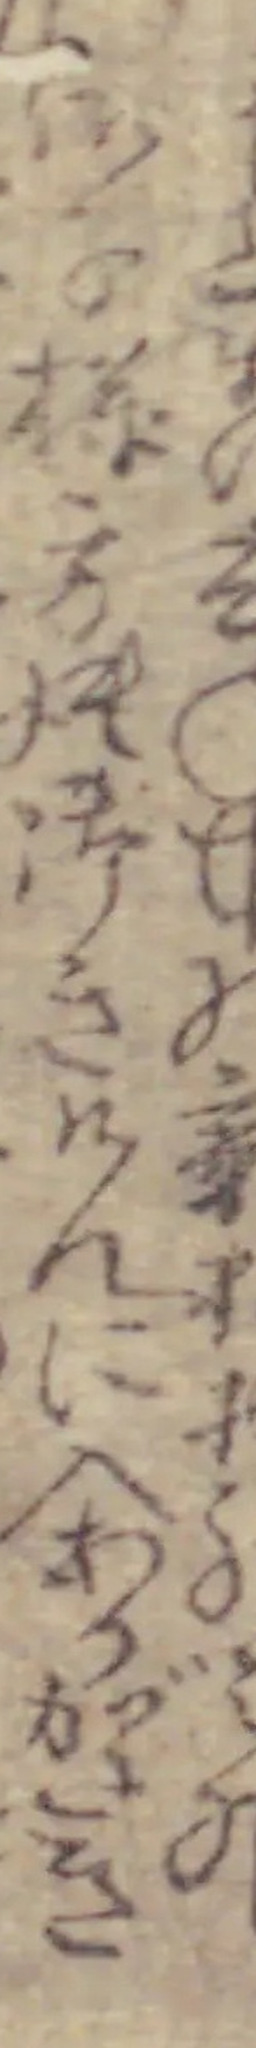御子様方の御きけんに入ありがたき
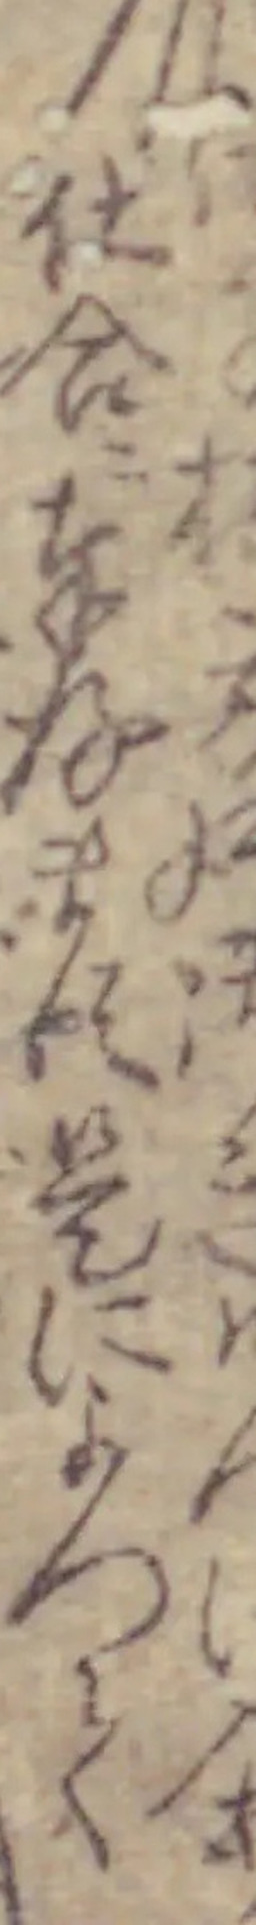仕合に奉存ます是によつて
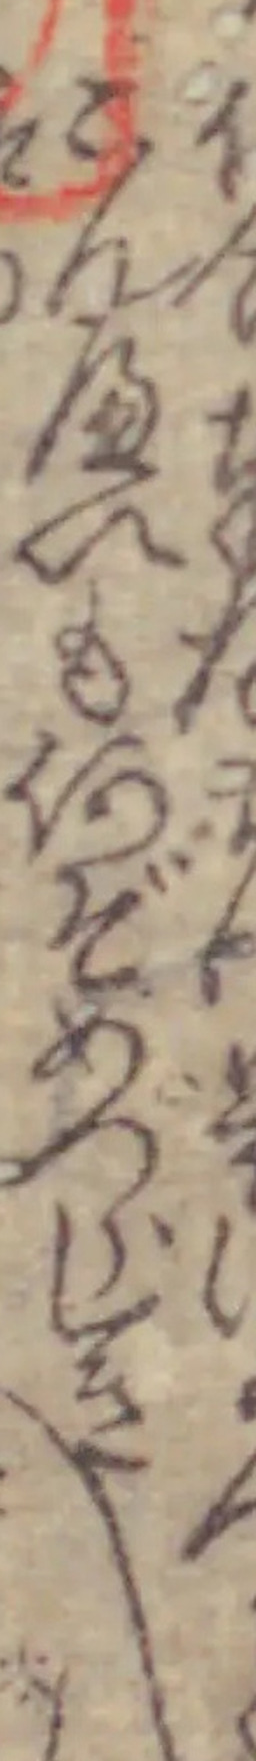こんへいも何ぞめづらしき
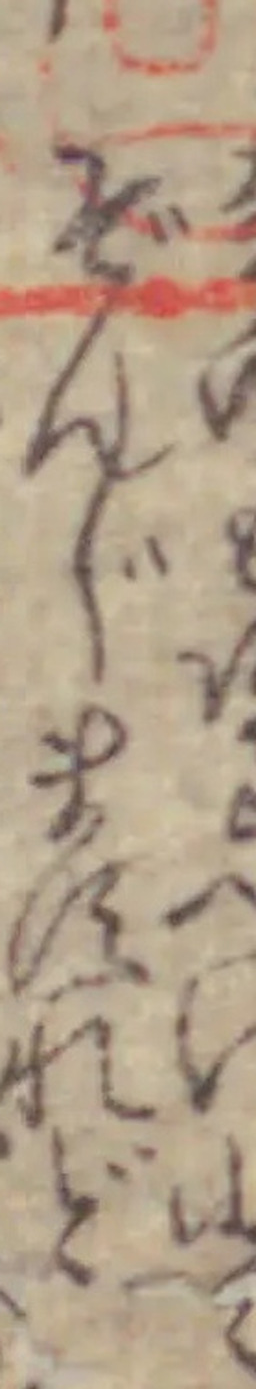ぞんじますれど
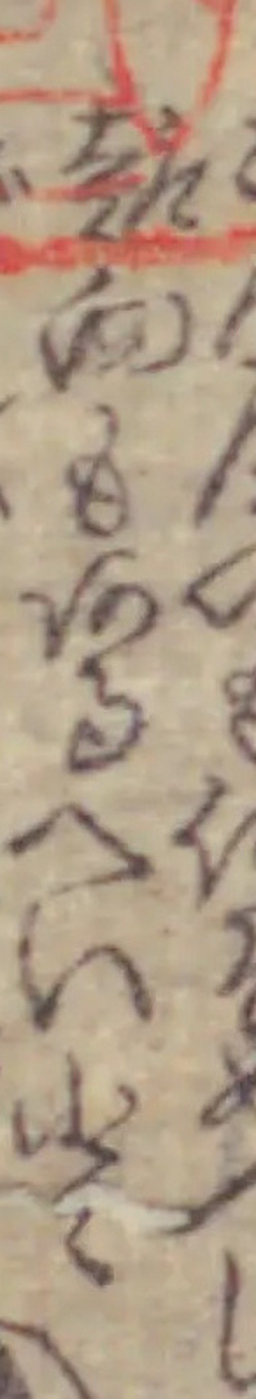趣向もあるへいと
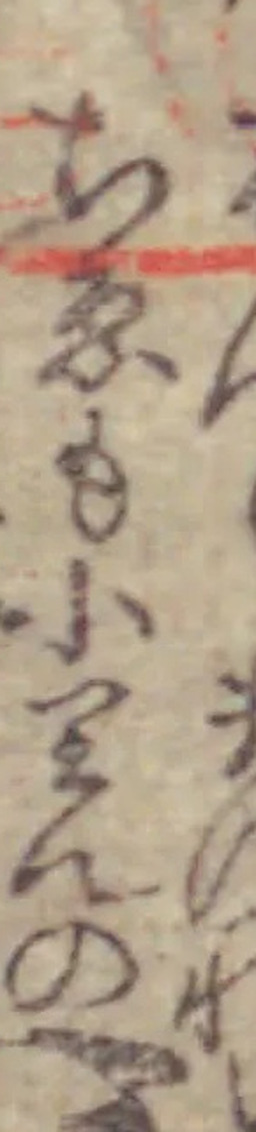ちゑも小りんの
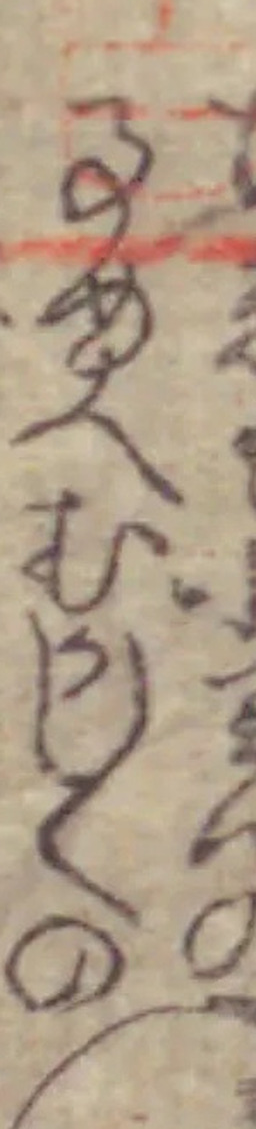事ゆへむかし〳〵の
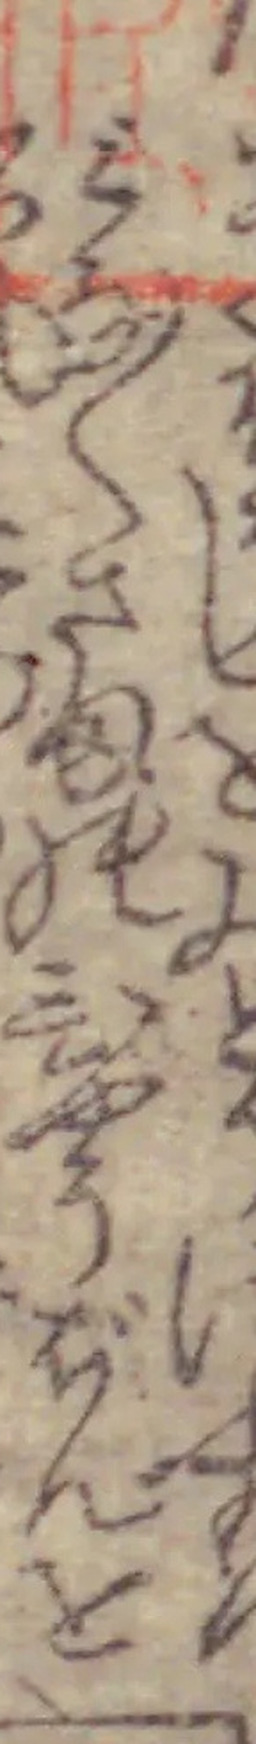みな〳〵さまのひやうばんを
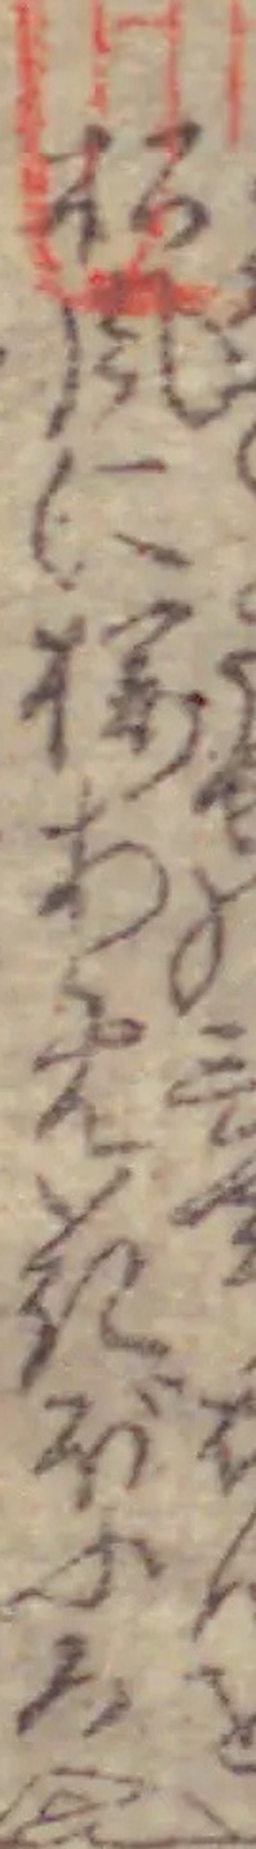松風に桜あめ花ぼふろ
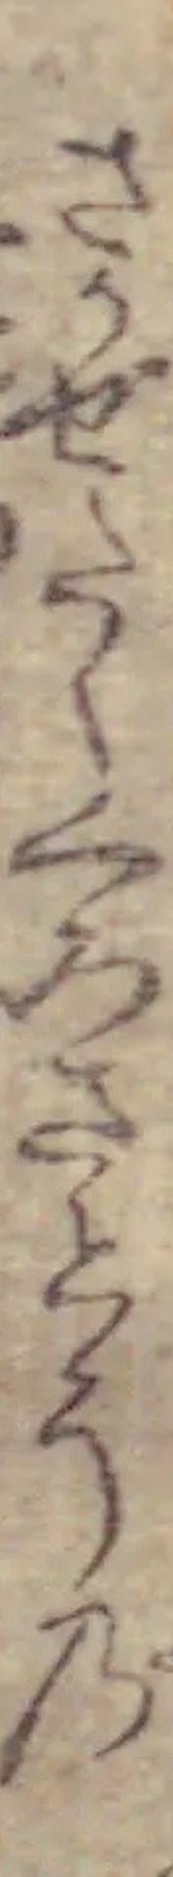さかせたくくろさとうの
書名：名代干菓子山殿 3巻
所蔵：国立国会図書館 National Diet Library, JAPAN
